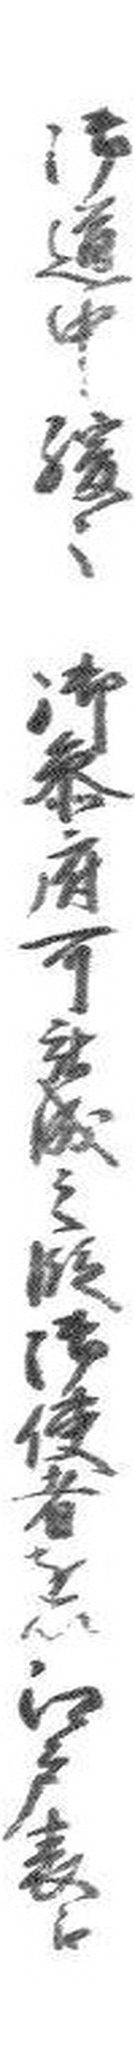御道中緩々御参府可被成之段御使者を以江戸表江
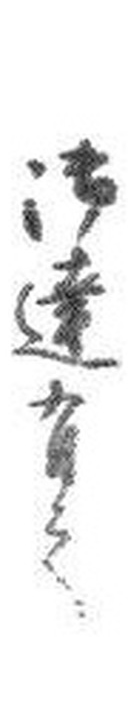御達有之
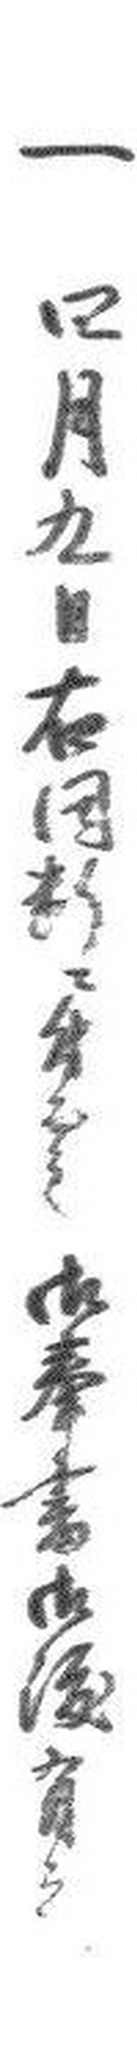一四月九日右同断ニ付而之御奉書御渡有之
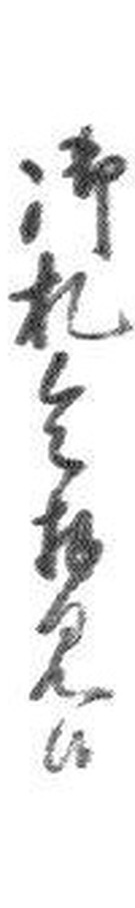御札令拝見候

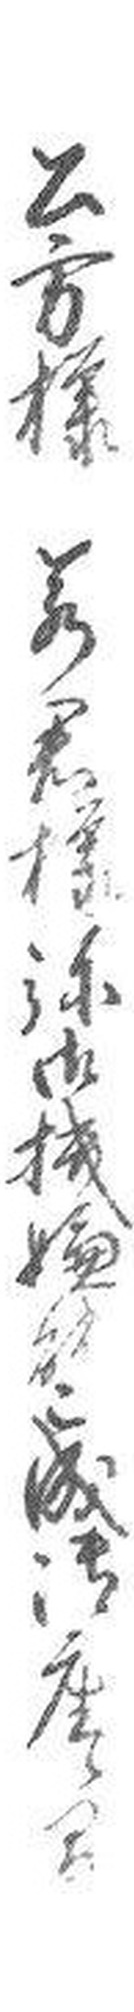公方様若君様弥御機嫌能被成御座候間
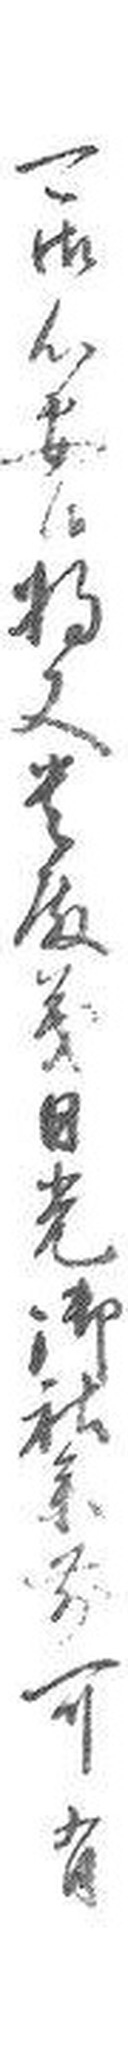可御心安候将又貴殿義日光御社参前可有
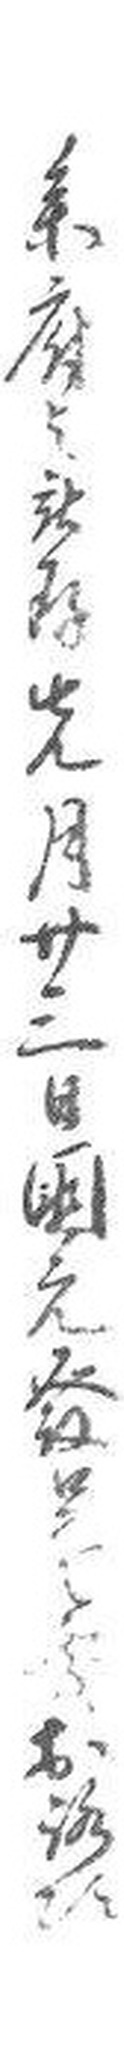参府と被存先月廿三日国元発足之処於路次
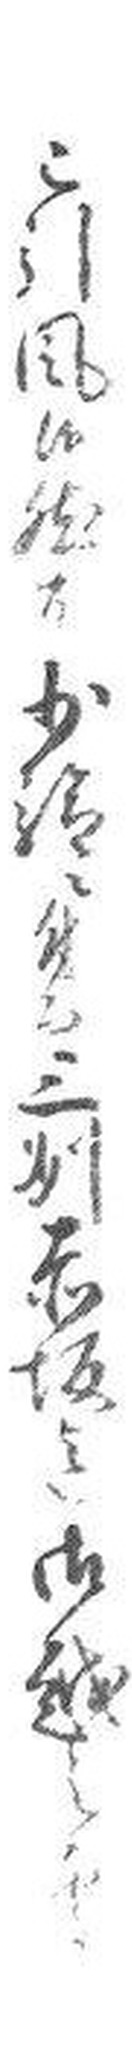被引風候然共少験ニ付而三州赤坂迄御越之処
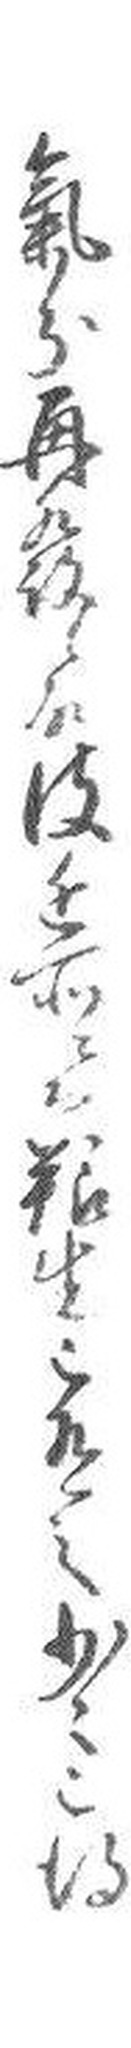気分再発候故彼近所ニ而養生被有之少々被得
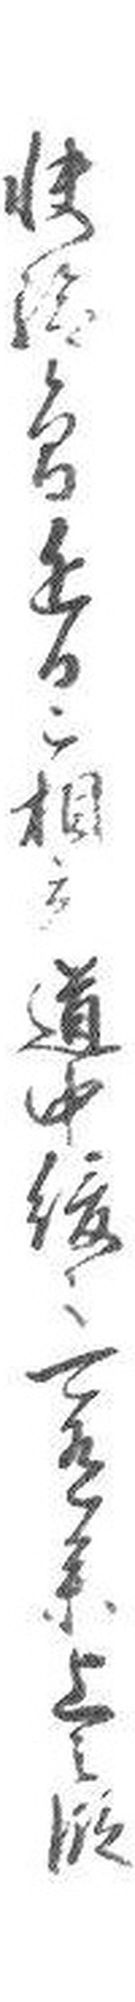快験候間近日被相立道中緩々可有参上之段
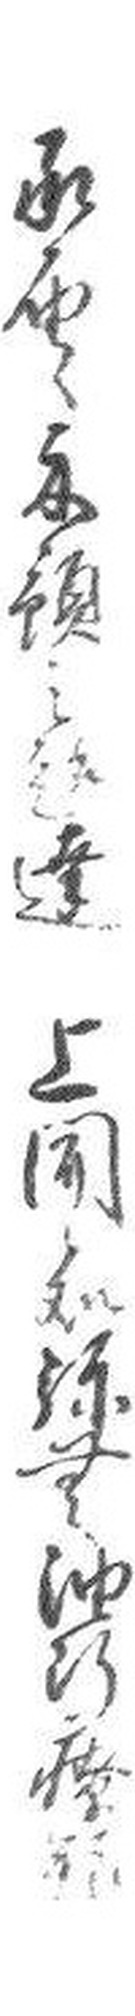承届候示預之趣達上聞候処弥無油断療養
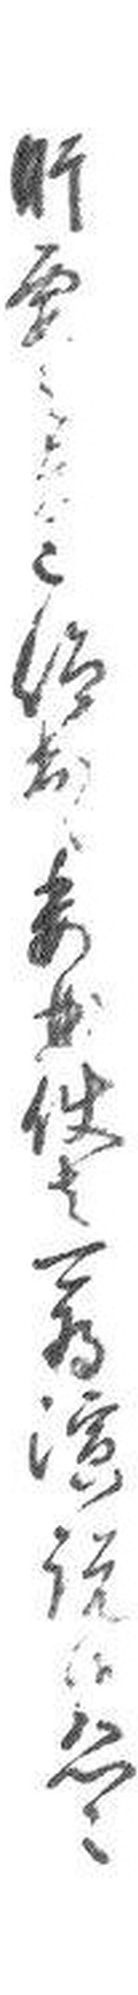肝要之旨被仰出候委曲使者可為演説候恐々
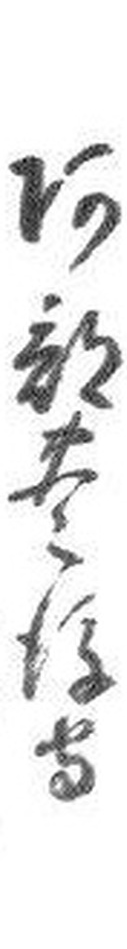阿部豊後守
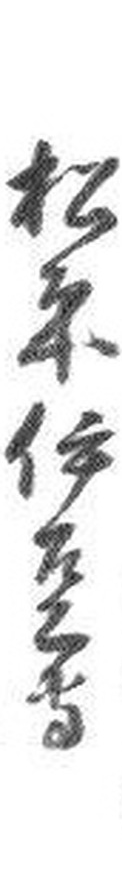松平伊豆守
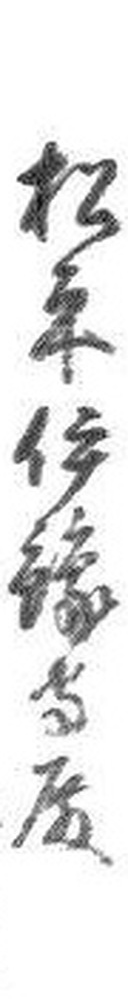松平伊予守殿
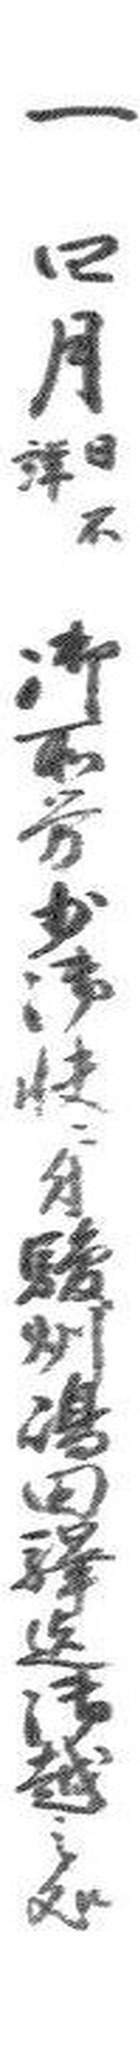一四月日不詳御所労少御快ニ付駿州嶋田駅迄御越之処
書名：家譜 四 忠昌公 従寛永七年到正保四年
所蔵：福井県文書館 Fukui Prefectural Archives
